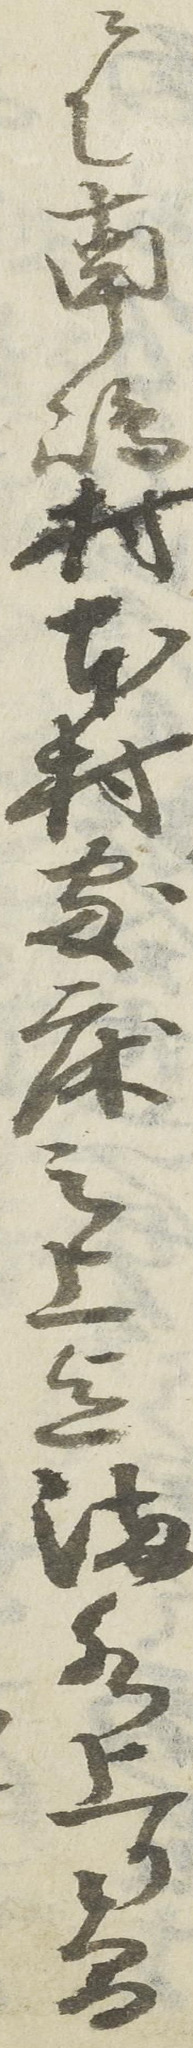ニて南嶋村本村家床之上迄満水上り候間
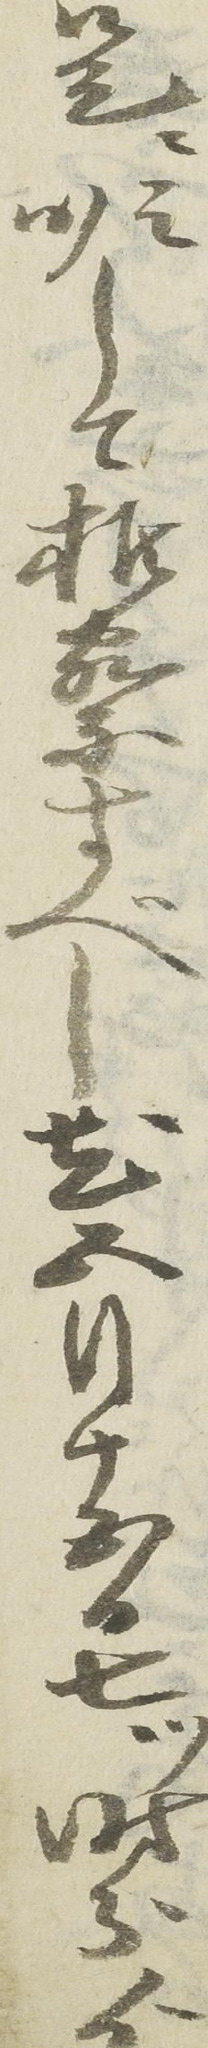是ニ順して推察すべし尤五月十五日七ツ時分ゟ

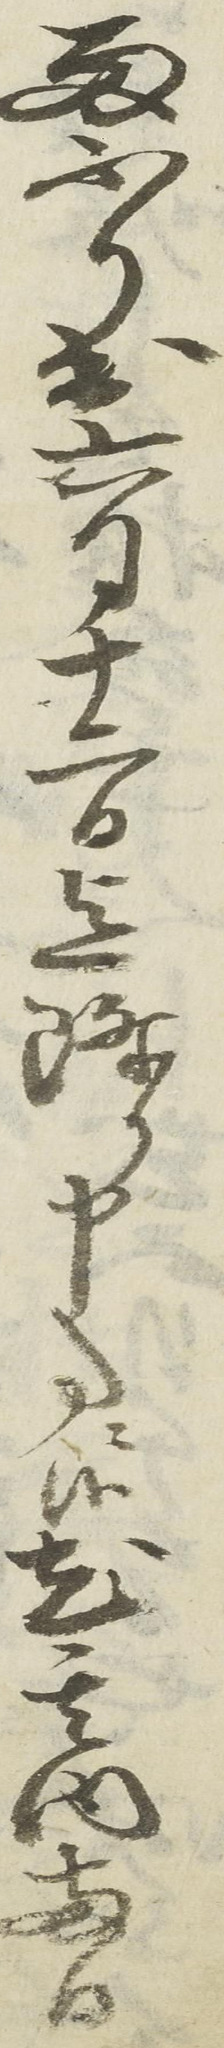雨ふり出六月十二日迄降り申事ニ候尤其内両日
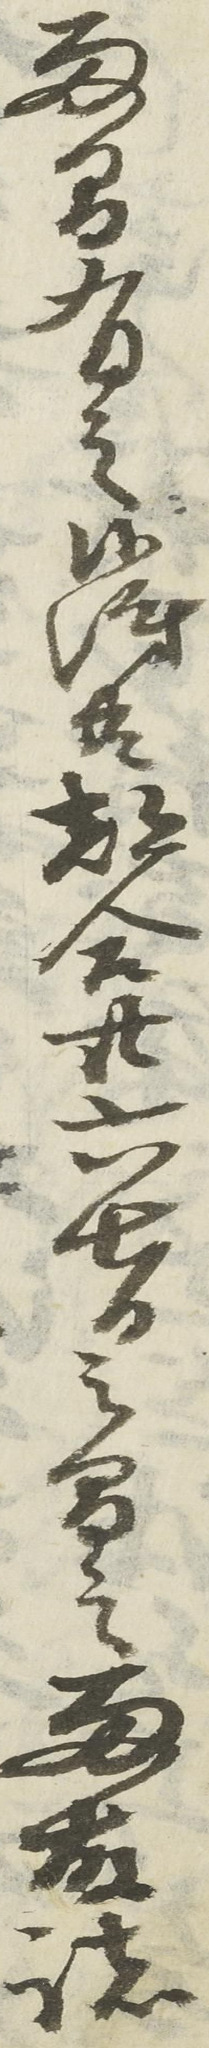雨間有之候得共都合廿六七日之間之雨故諸
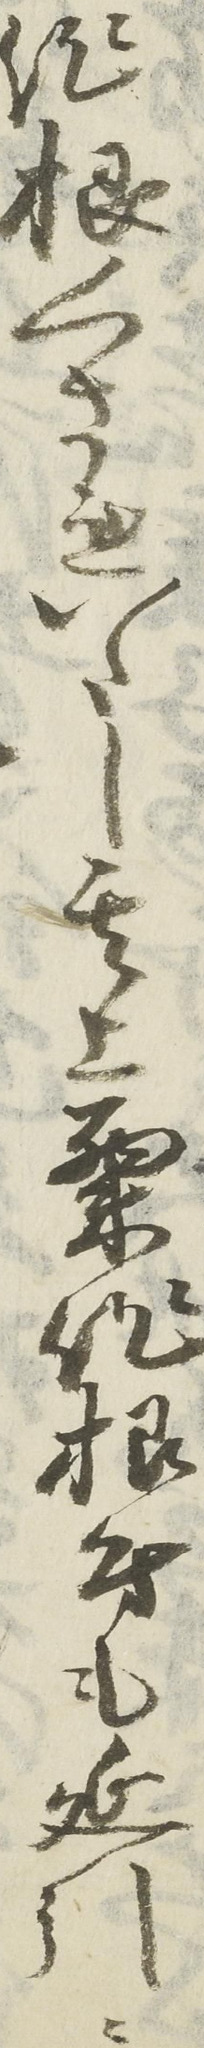作根くされいたし其上粟作根付も延引ニ
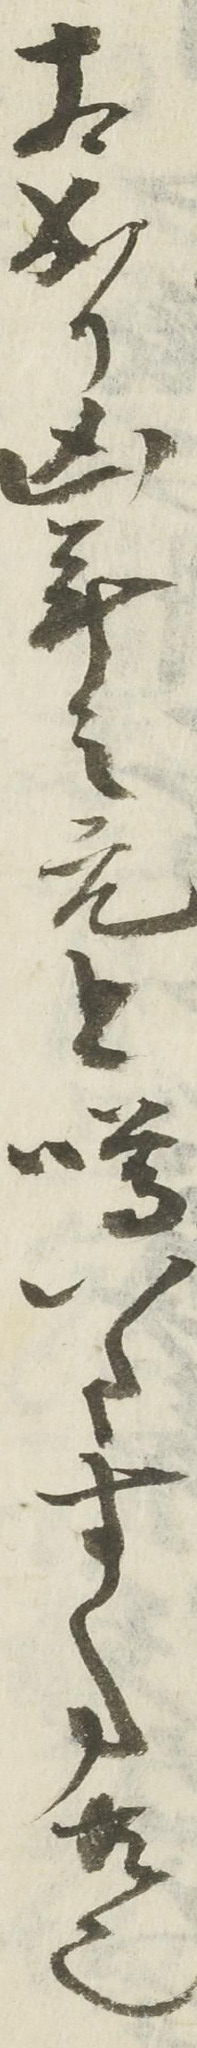相成凶年之元と噂いたす事共也
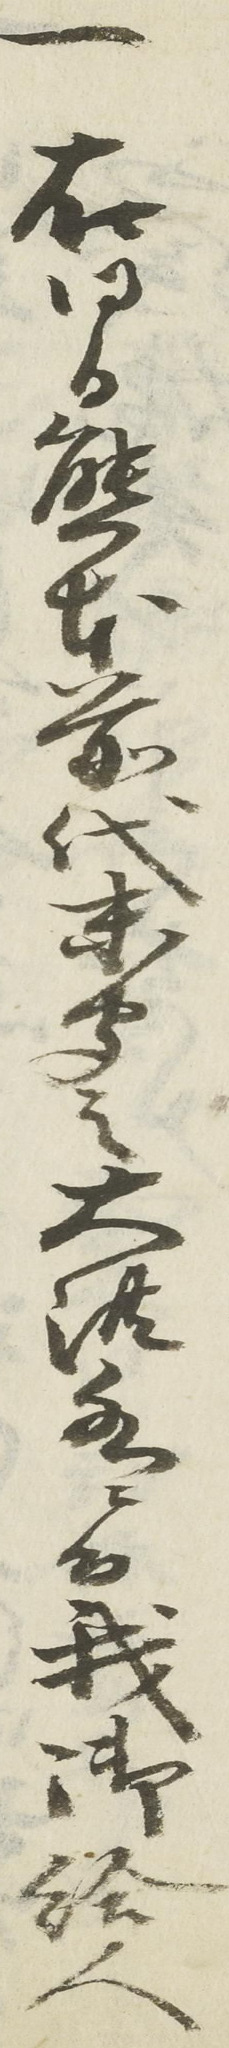一右同日熊本前代未聞之大洪水ニ而我御給人
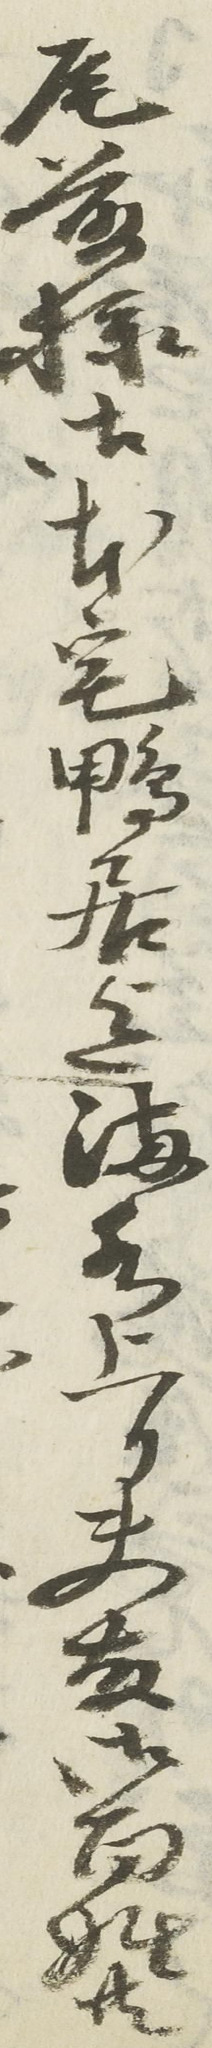尾藤様御本宅鴨居迄満水上り夫故御百姓共
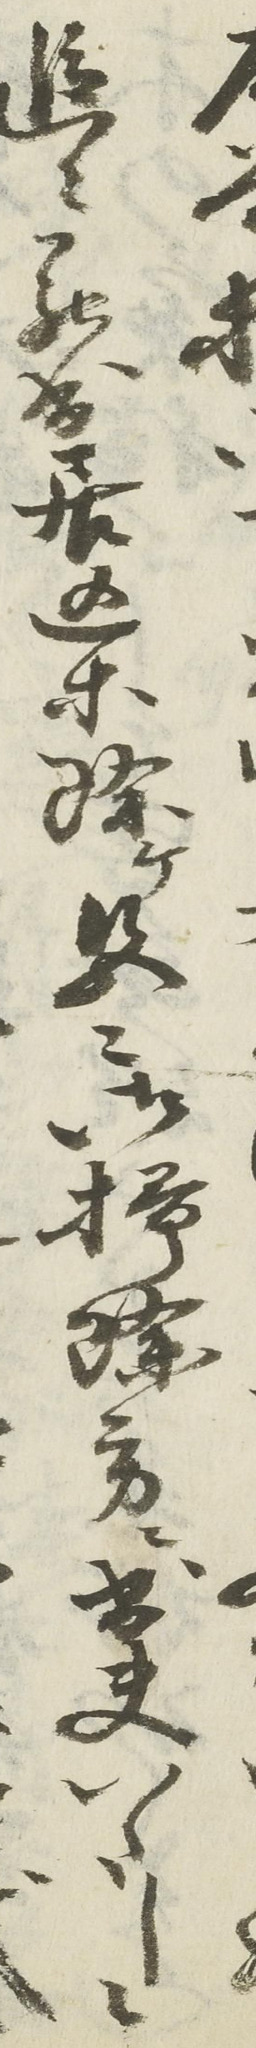追々罷出居込等除ヶ色々御掃除方二出夫いたし二
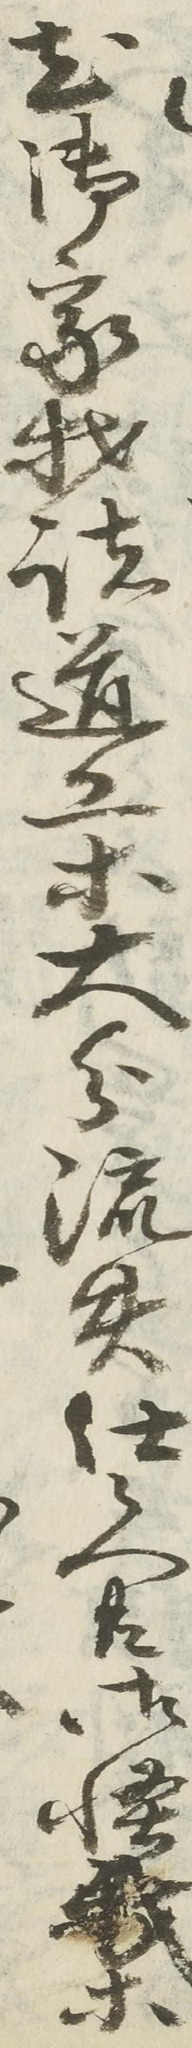尤御家財諸道工等大分流失候へ共御怪我等
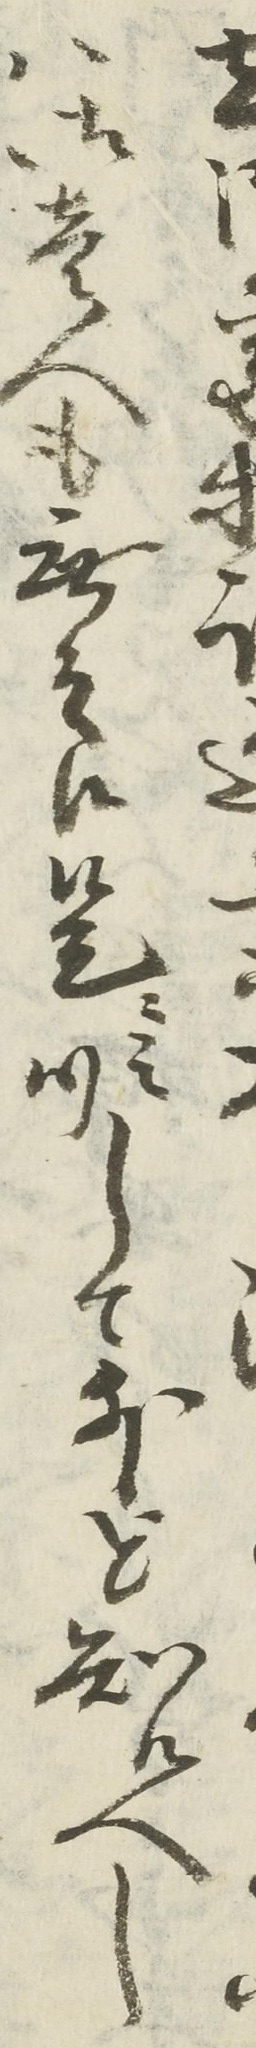は御壱人も無之候是ニ順して外を知ルへし
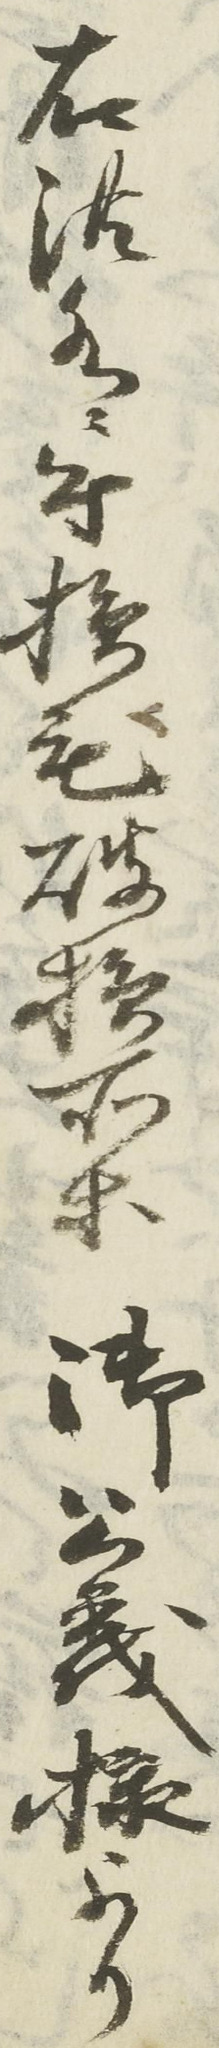右洪水ニ付損毛破損所等御公儀様より
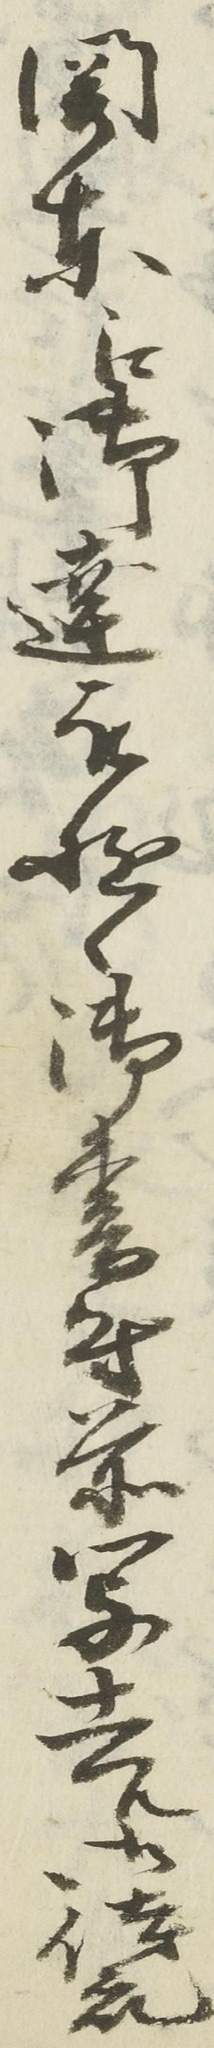関東江御達被遊候御書付前写去ル御侍衆
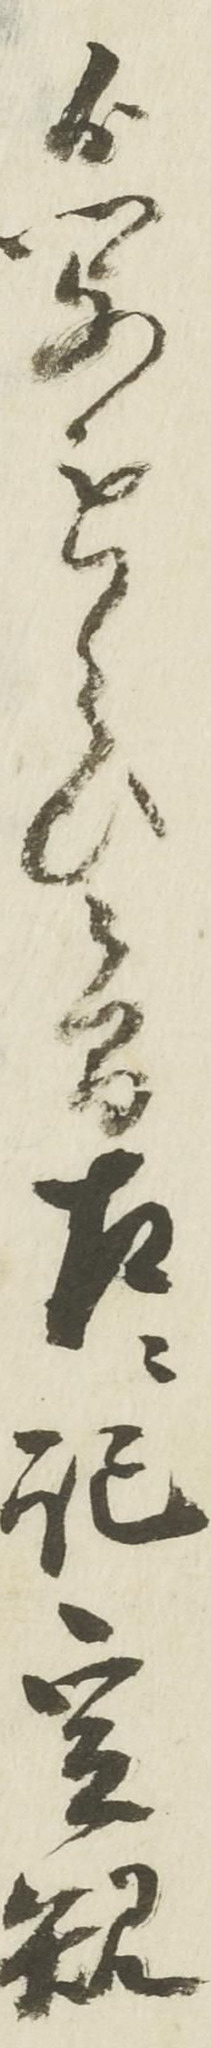ゟ写もらひ候間左に記定規
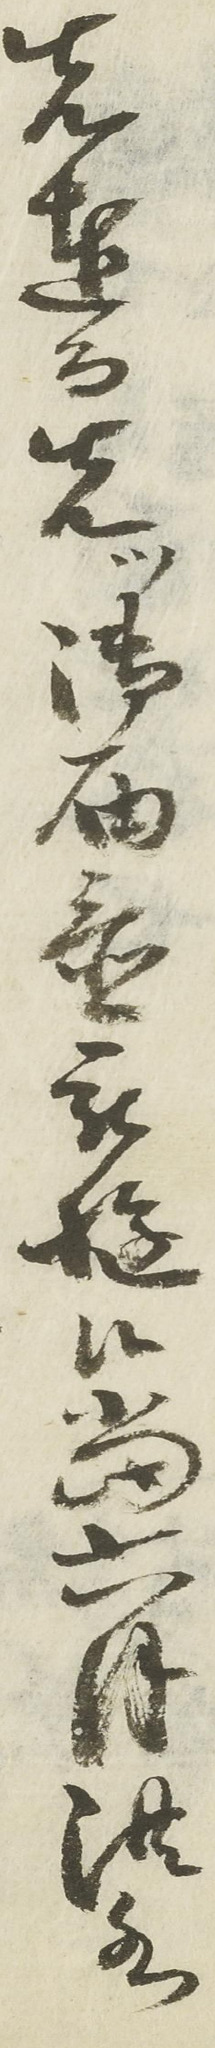先達而先ツ御届置被遊候当六月洪水
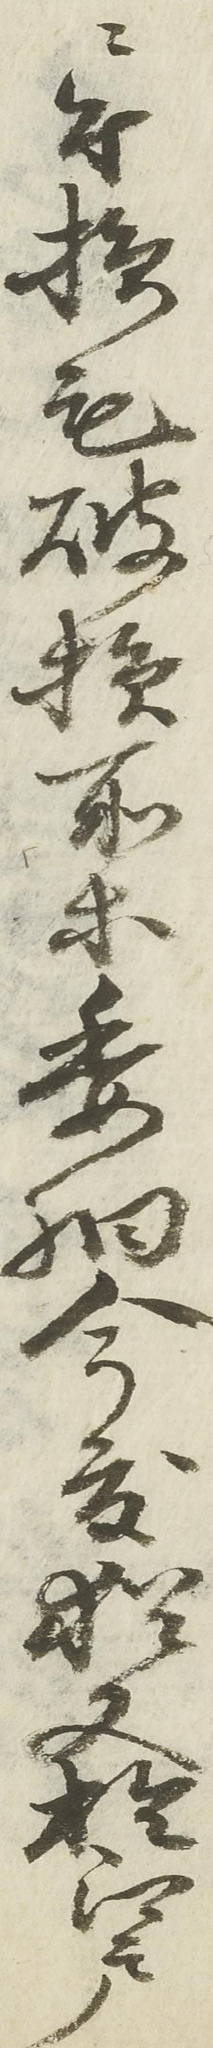ニ付損毛破損所等委細今度猶又於江戸
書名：後見笑
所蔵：東京大学地震研究所図書室 Earthquake Research Institute Library, The University of Tokyo, JAPAN
